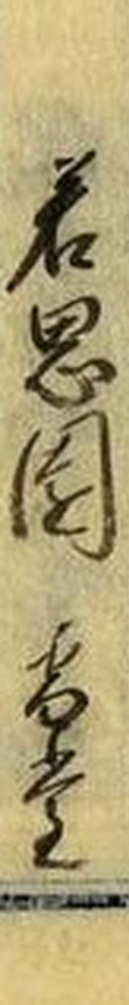若思園香堂
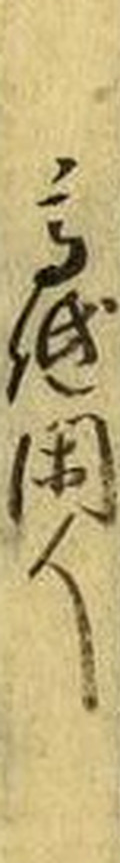高低閑人
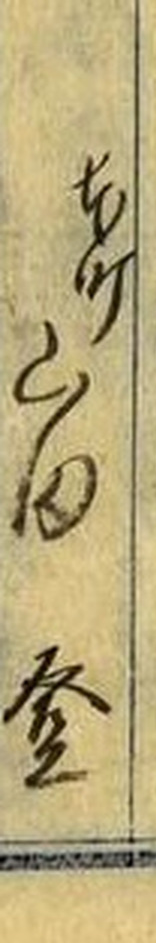本町山田登
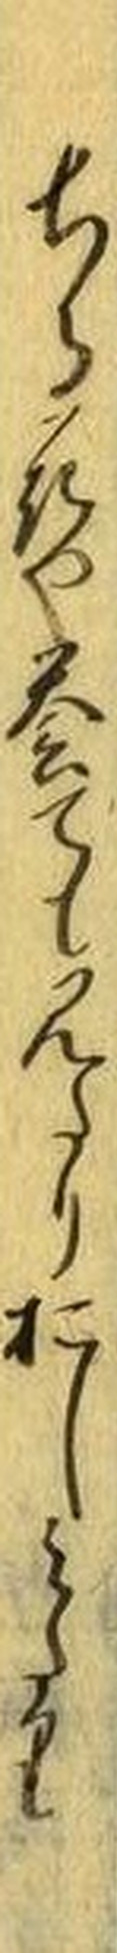ちる花や誉ても見たりおしえたり
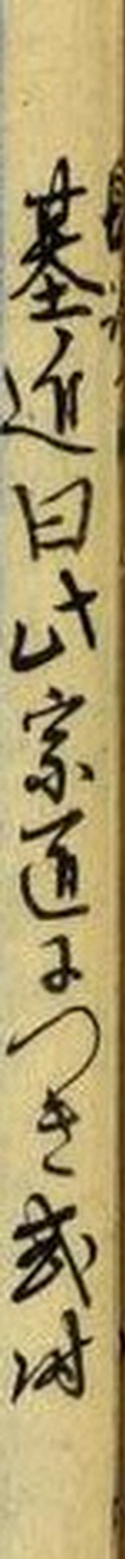基近曰此宗匠につき或時
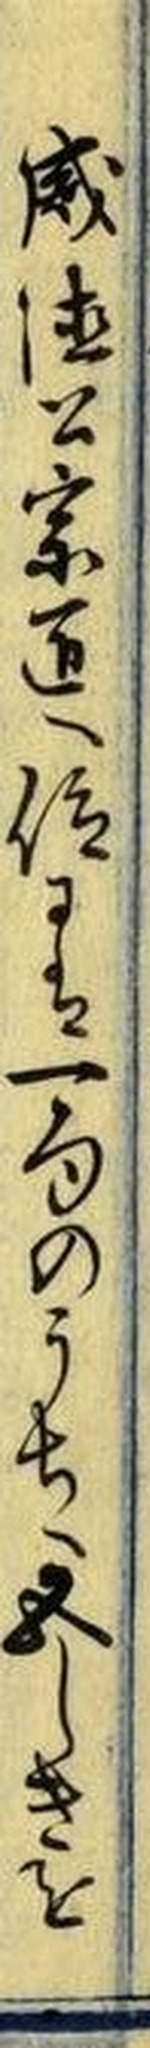威徳公宗匠へ仰には一句のうちへ五しきを
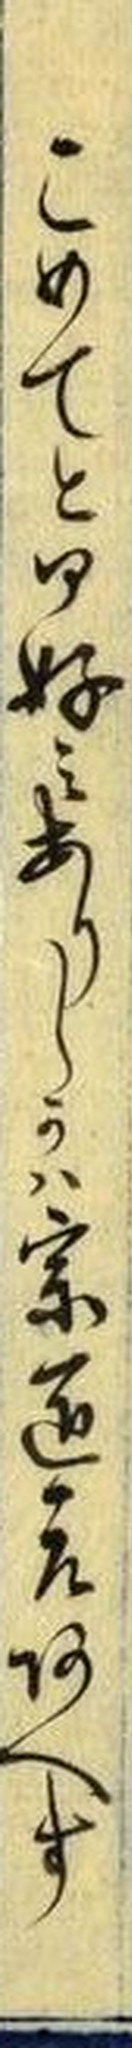こめてと御好みありしかは宗匠取あへす
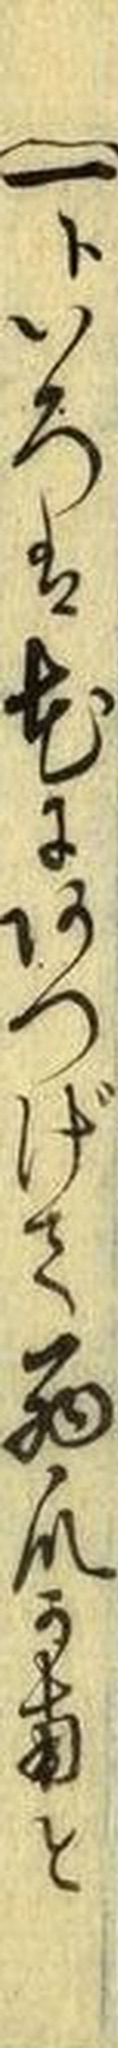一といろは花にあつげて西瓜かなと
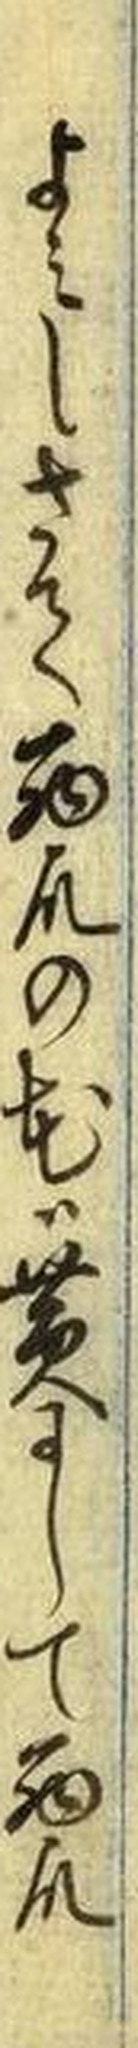よみしさて西瓜の花は黄にして西瓜
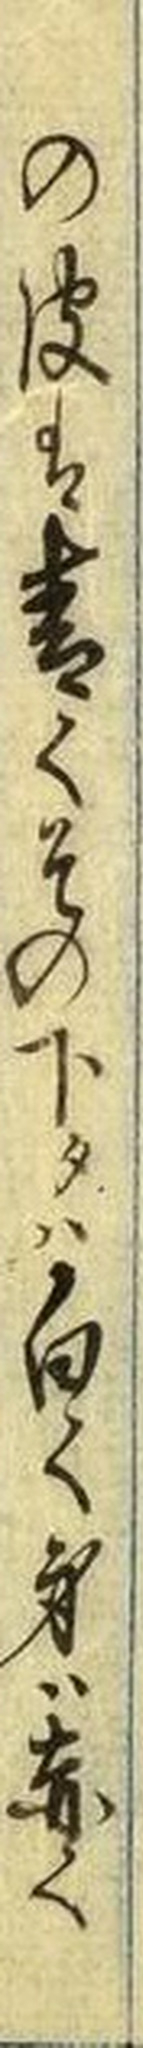の皮は青くその下タは白く身は赤く
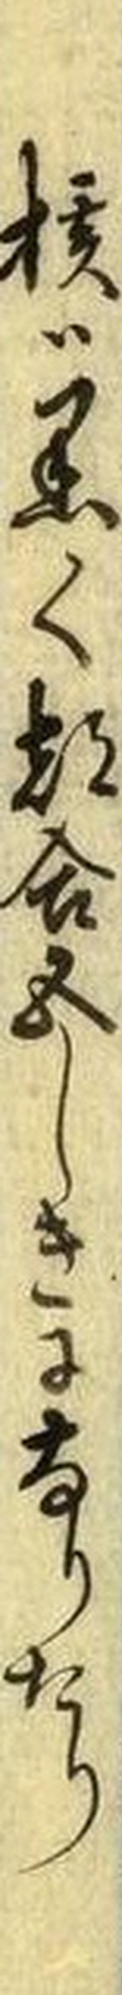核は黒く都合五しきになりたり
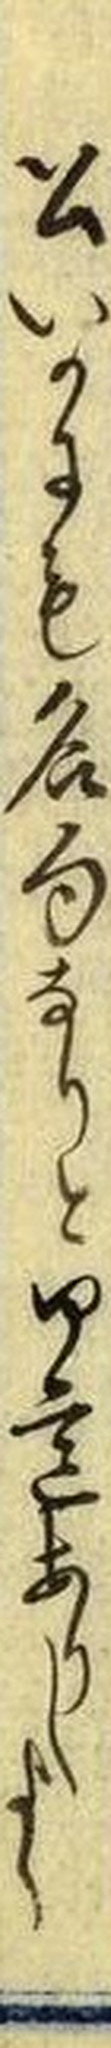公いかにも名句なりと御意ありしよし

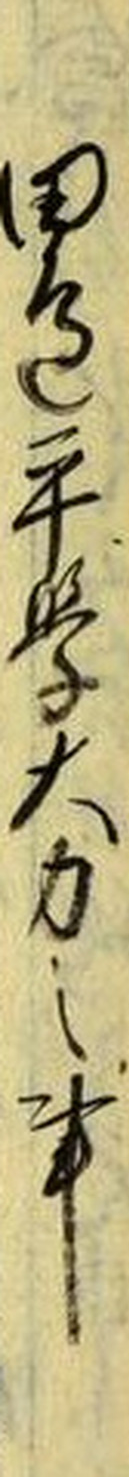田辺平学大力之事
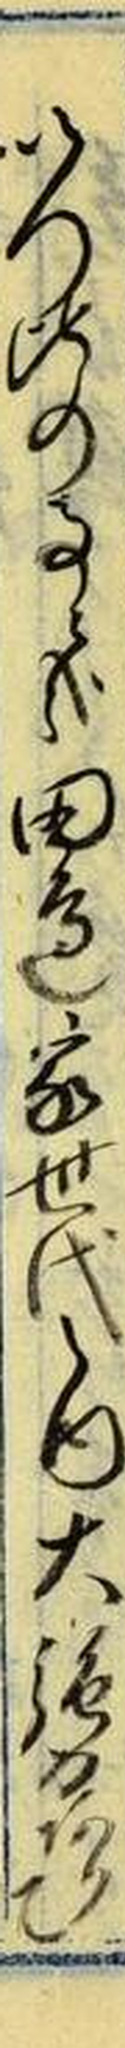いつ頃の事ニ哉田辺家世代之内大強力ありて
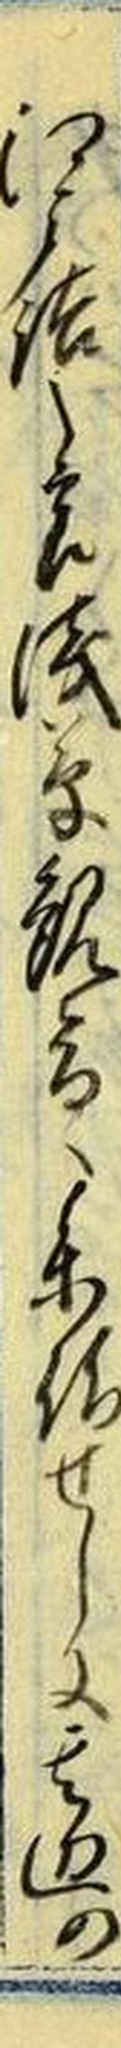江戸詰之節浅草観音へ参詣せしに其辺の
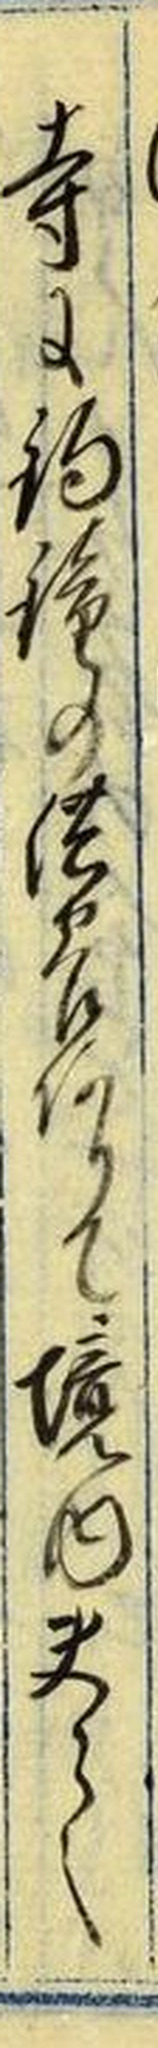寺に釣鐘の供養ありて境内夫々之
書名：温古集 三巻
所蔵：福井県文書館 Fukui Prefectural Archives
